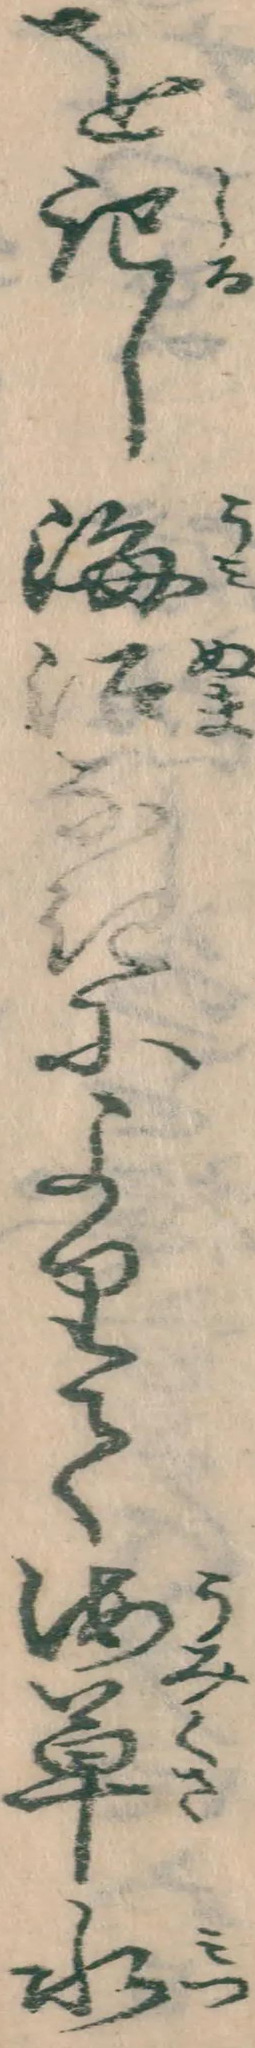を記し海沼なきによりて海草水
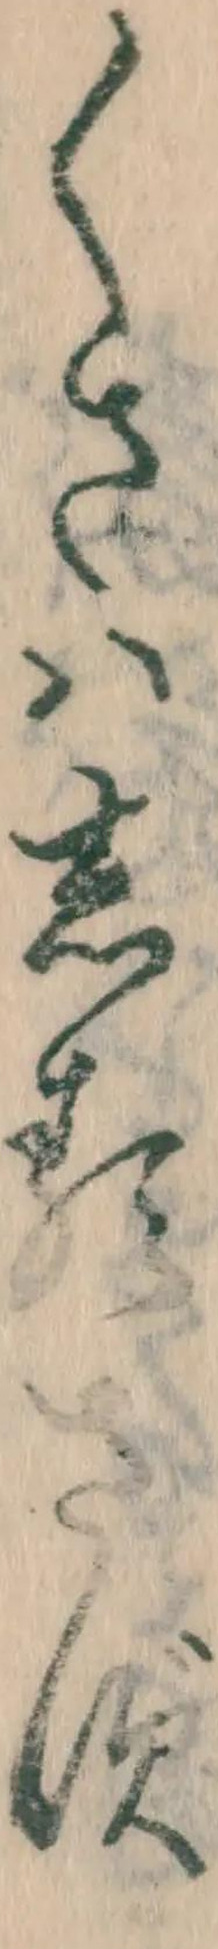くさはしるさず
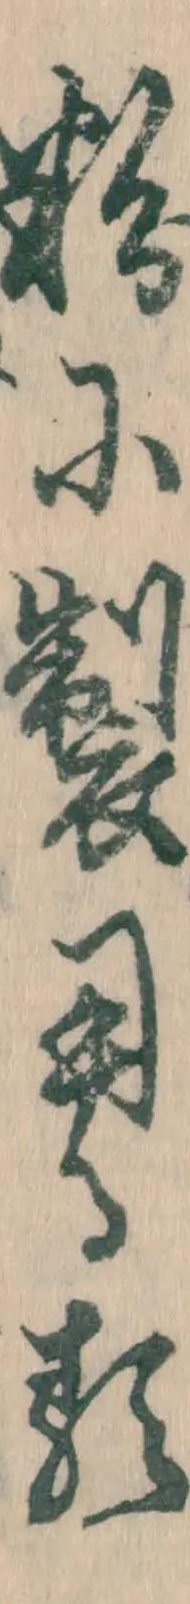粉に製用る類
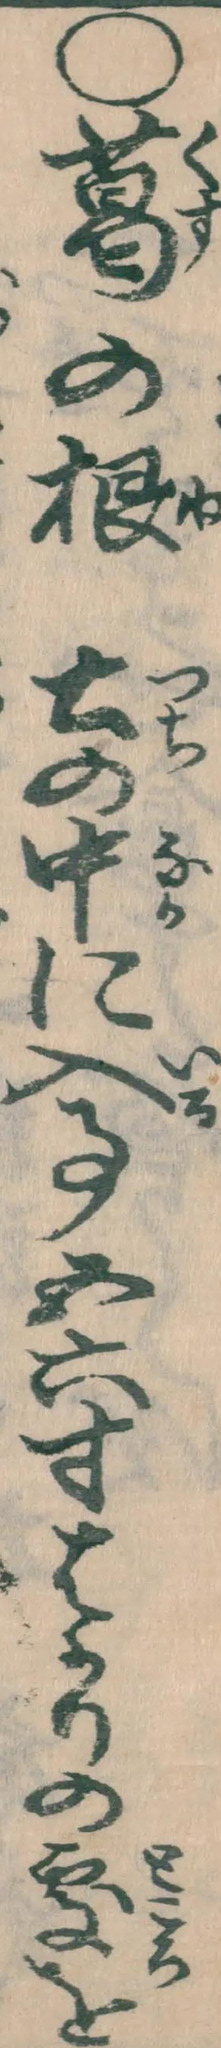〇葛の根土の中に入事五六寸はかりの処を
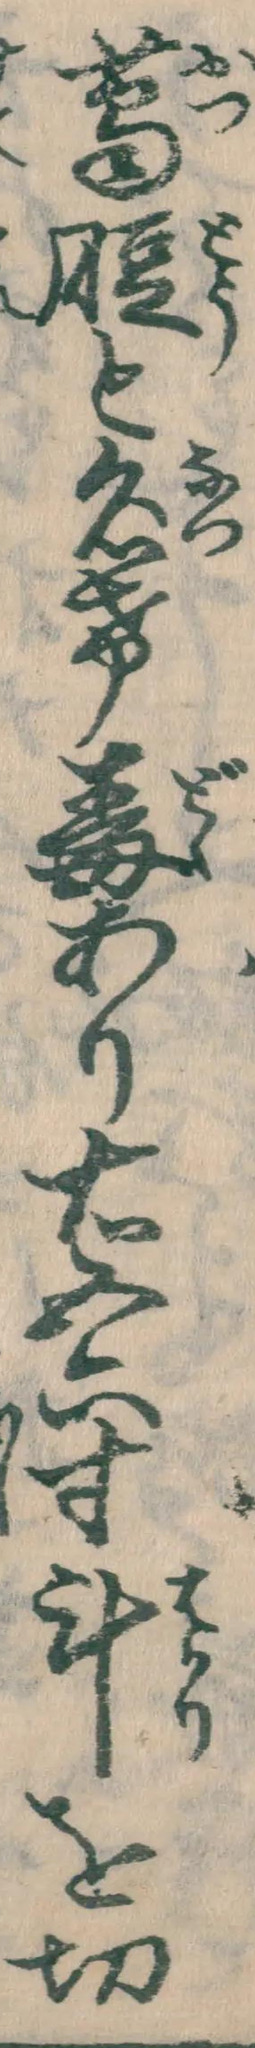葛脰と名け毒あり右五六寸斗を切
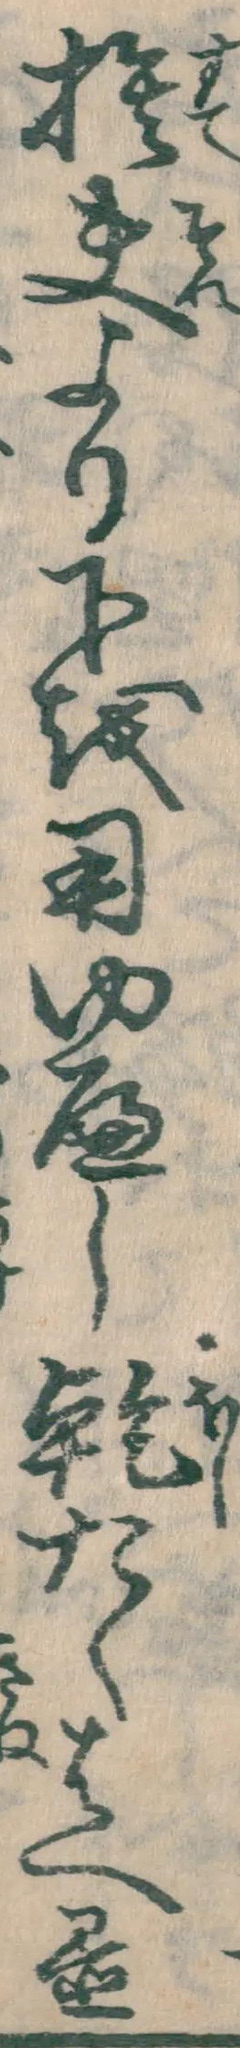捨夫より下を用ゆべし乾たくはへ置
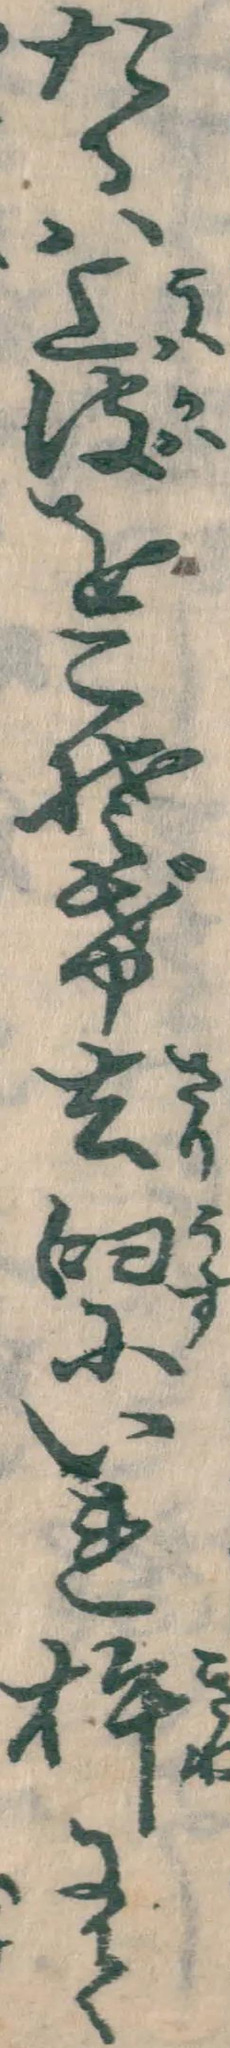たるは上皮をこそぎ去臼にいれ杵にて
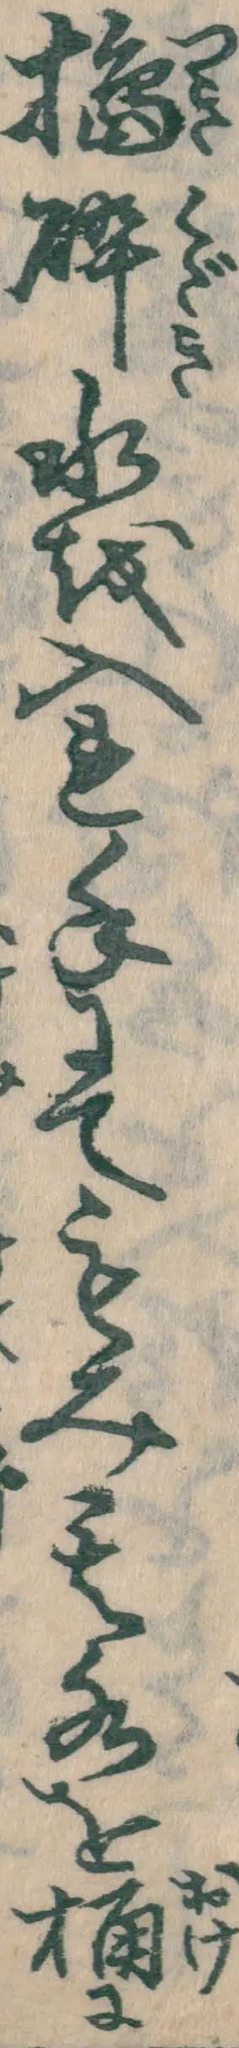搗砕水を入れ手にてもみその水を桶に
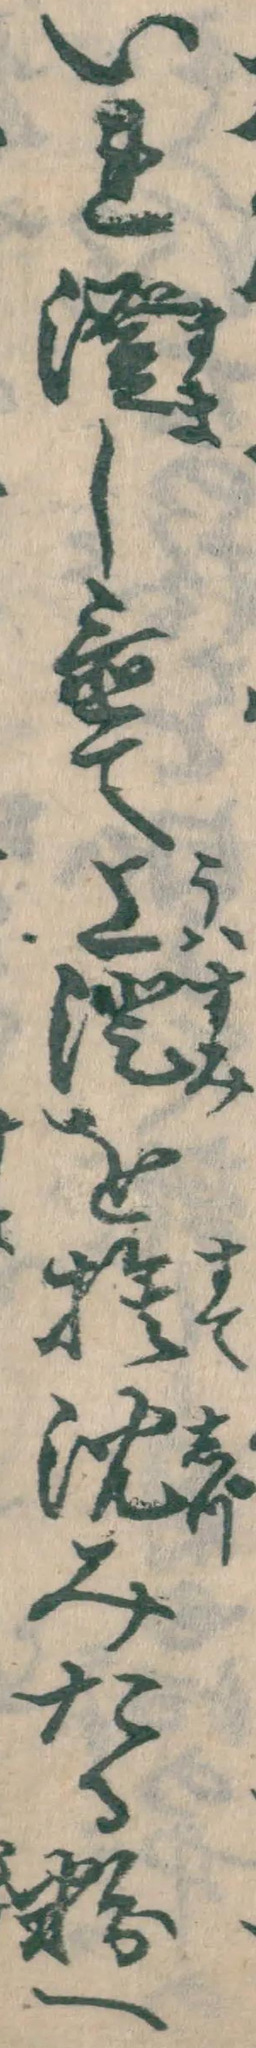いれ澄し置て上澄を捨沈みたる粉へ
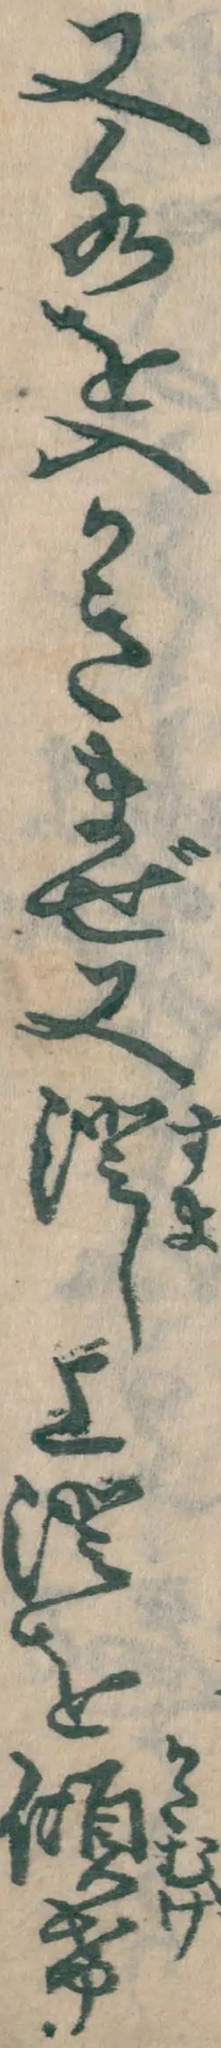又水を入かきまぜ又澄し上澄を傾希

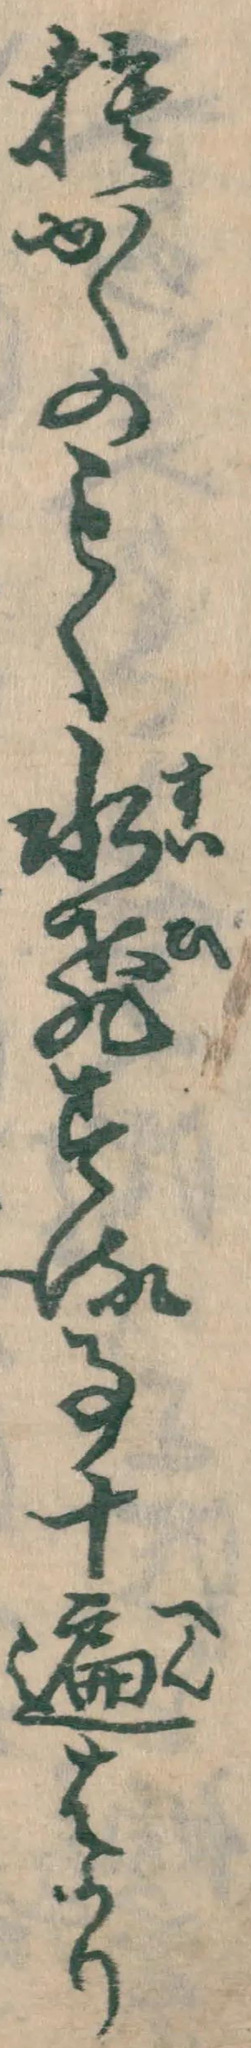捨かくのことく水飛する事十遍はかり
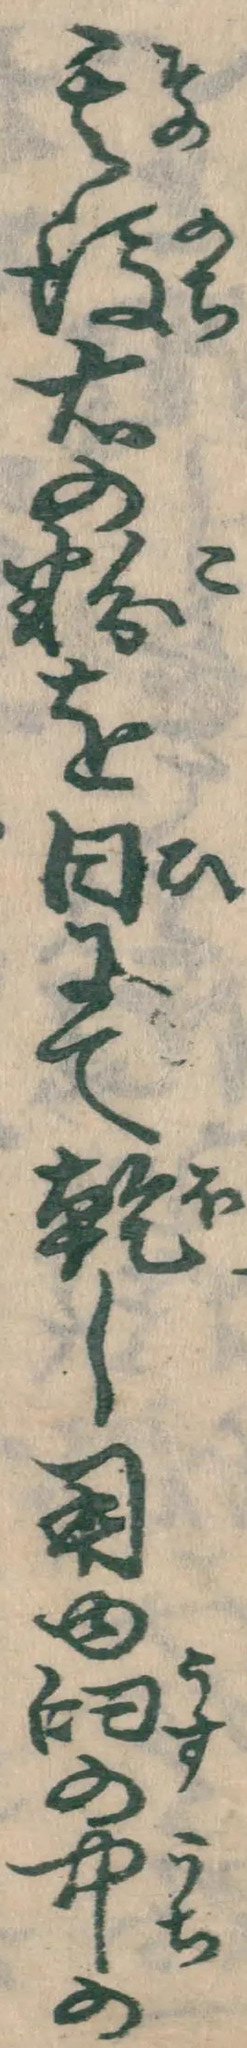その後右の粉を日にて乾し用ゆ臼の中の
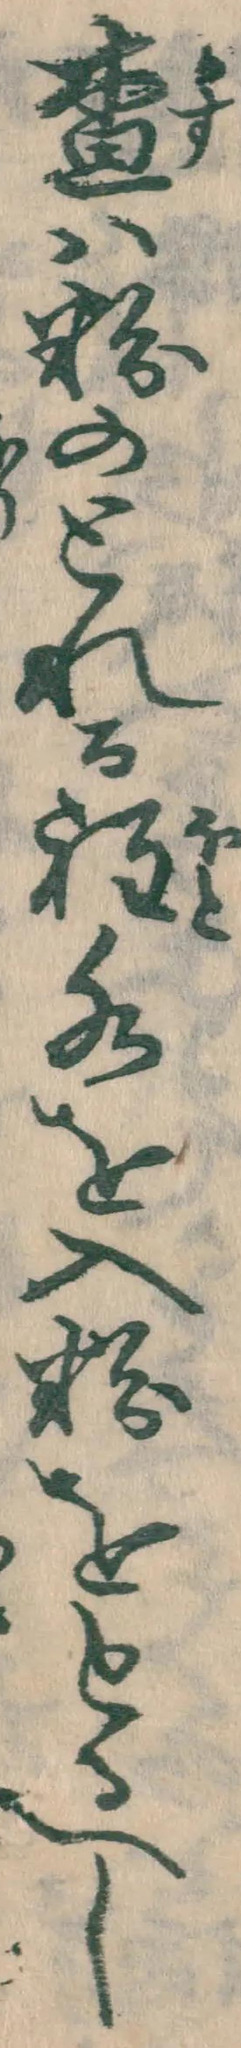査は粉のとれる程水を入粉をとるへし
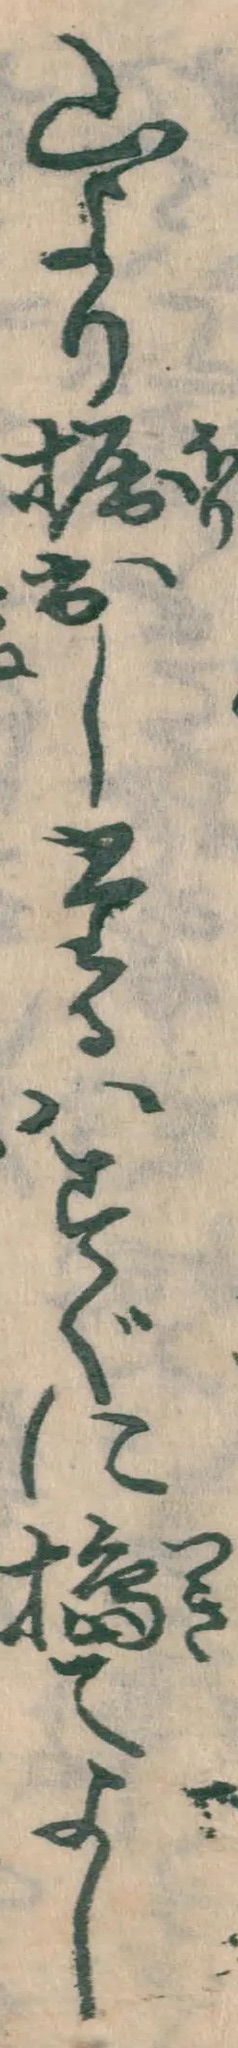山より掘出したるはすぐに搗てよし
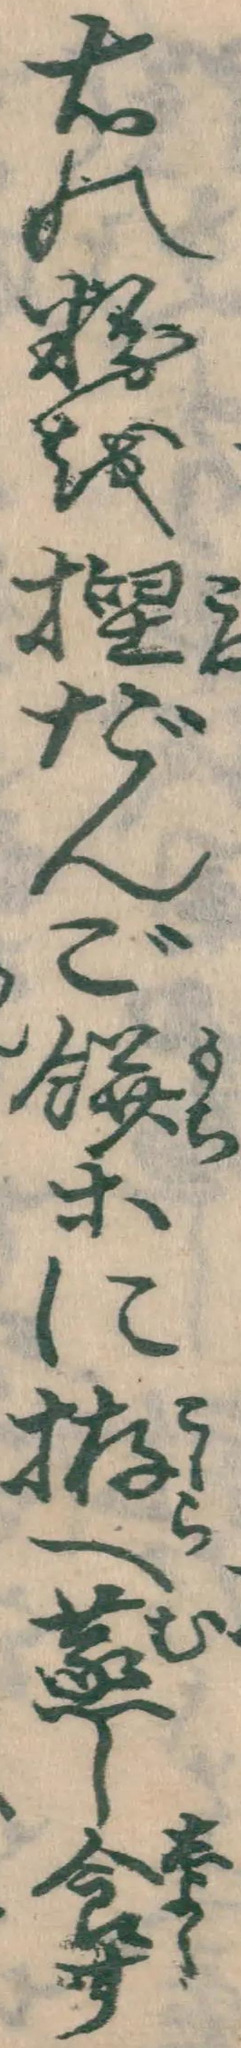右の粉を捏だんご餅等に拵へ蒸し食す
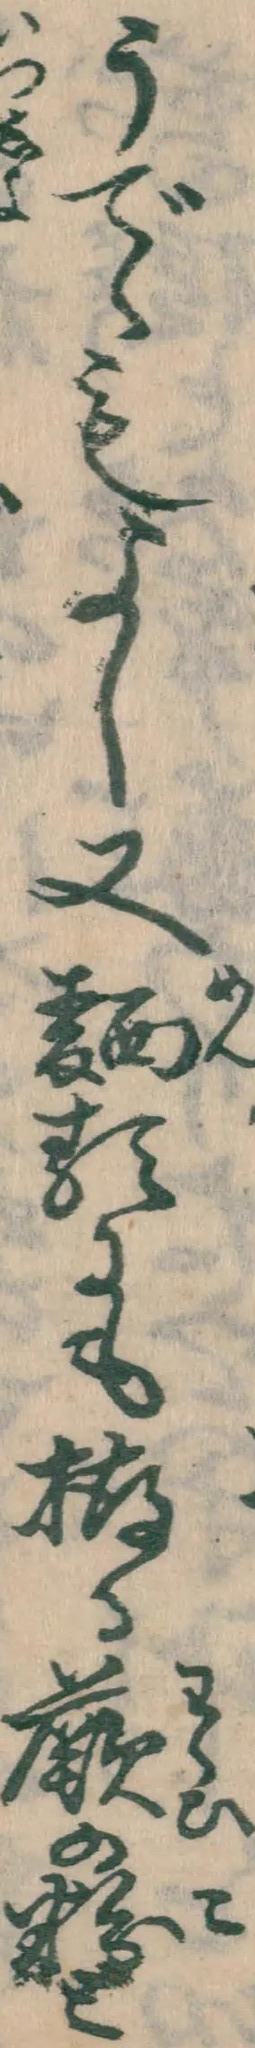うでゝもよし又麺類にも拵る蕨の粉と
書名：救荒鄙諭
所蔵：国立国会図書館 National Diet Library, JAPAN
